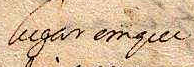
lugar em que
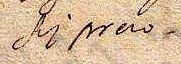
foj prezo
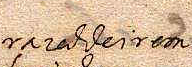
razaõ de irem
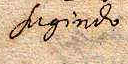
fugindo
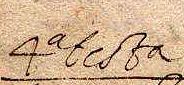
4a testa.
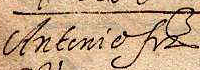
Antonio frz̄
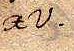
xv.
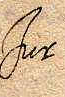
Jur
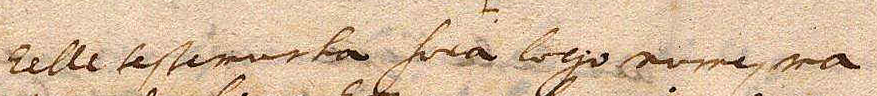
E elle testemunha fora logo na mesma
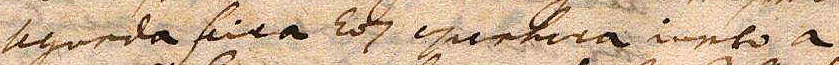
segunda feira E os apanhara iunto a
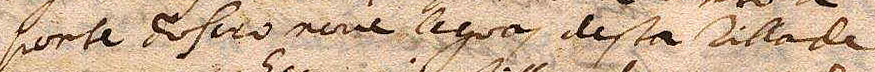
ponte do soro noue legoas desta Villa de
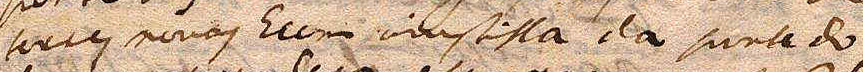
torres nouas E com a iustissa da ponte do
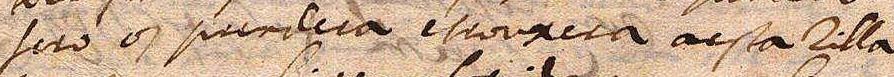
soro os prendera e trouxera a esta Villa
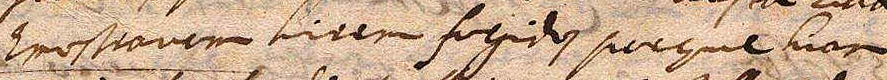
E mostrauam hirem fugidos porque hiam
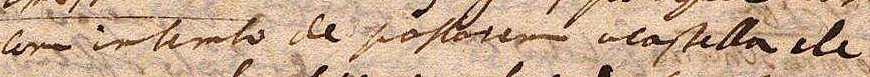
com intemto de passarem a castella e le
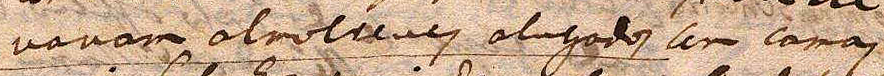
uauam almocreues alugados com camas
